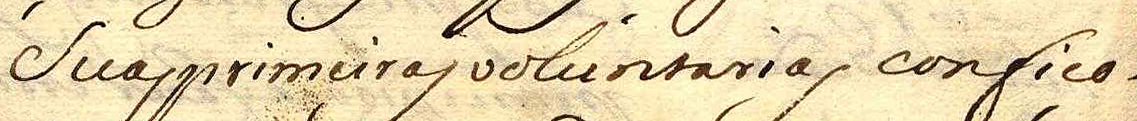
Suas primeiras voluntarias confiço
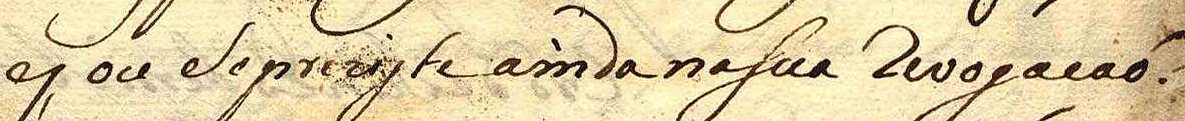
es, ou Se preziste ainda na sua Revogaçaõ?
